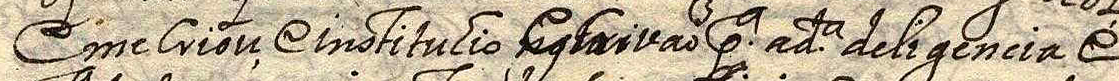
E me Criou, e instituhio Escrivaõ p.a a d̄.a deligencia e
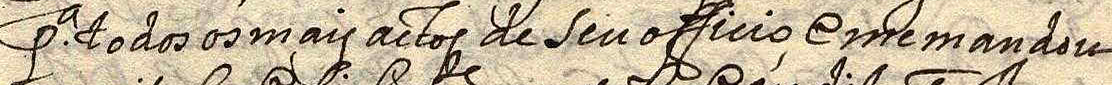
p.a todos os mais actos de seu officio, e me mandou
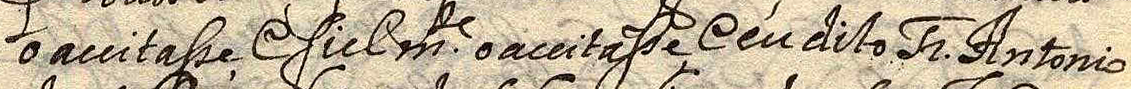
o aceitasse, e fielm.te o aceitasse, e eu dito Fr. Antonio
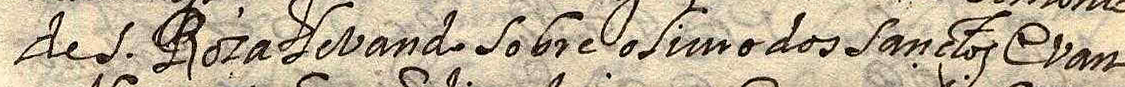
de S. Roza Levando sobre o Liuro dos Sanctos Evan
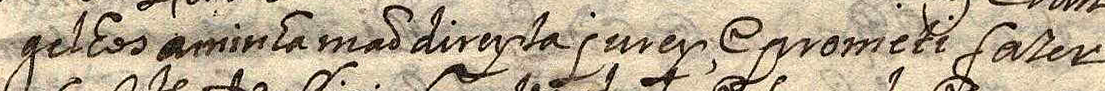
gelhos a minha maõ direyta jurey, e prometi fazer
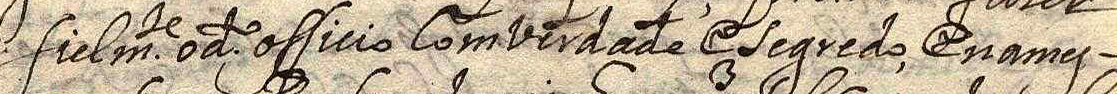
fielm.te o d̄.o officio Com verdade e segredo, e na mes
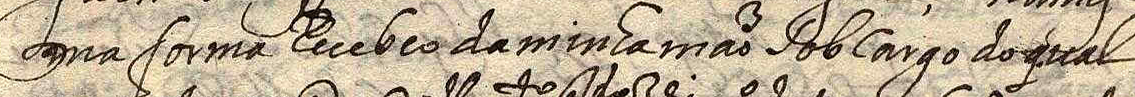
ma forma Recebeo da minha maõ sob cargo do qual
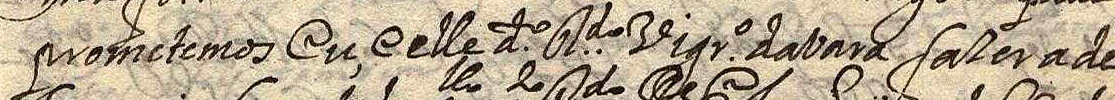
prometemos eu, e elle d̄.o R.do Vigr.o da vara fazer a de
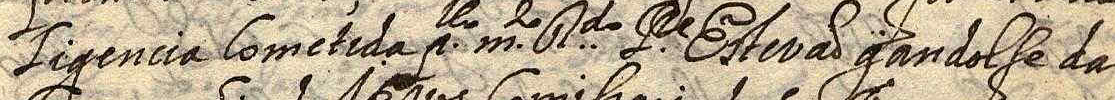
Ligencia Cometida p.lo m.to R.do P.e Estevaõ gandolfe da
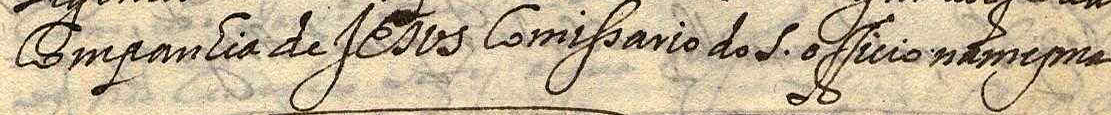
Companhia de Jesus Comissario do S. officio na mesma
